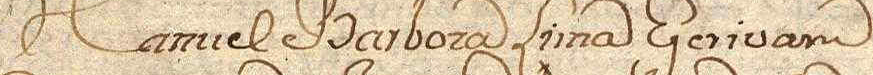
Manuel Barboza Lima Escrivam
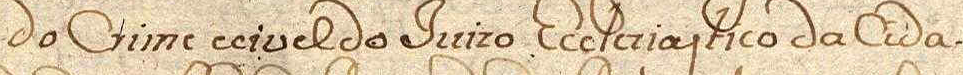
do Crime e civel do Iuizo Eccleziastico da Cida
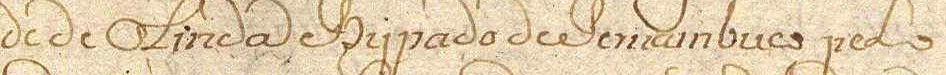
de de oLinda, e Bispado de Pernambuco peLo
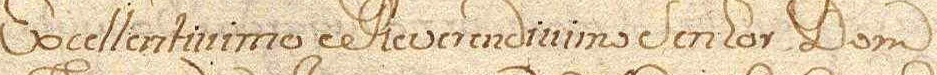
Excellentissimo e Reverendissimo Senhor Dom
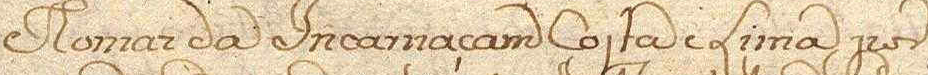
Thomaz da Incarnaçam Costa e Lima por
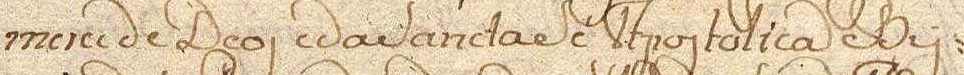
merce de Deos e da Sancta Sé Apostolica Bis
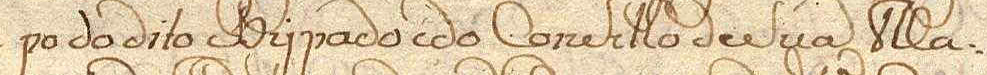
po do dito Bispado e do Conselho de Sua Ma
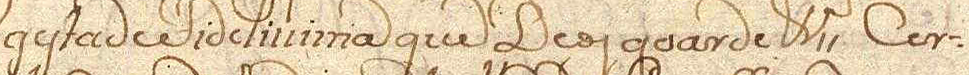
gestade Fidelissima que Deos guarde &ra// Cer
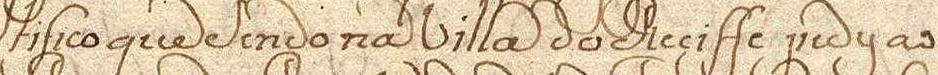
tifico que sendo na Villa do Reciffe pedy ao
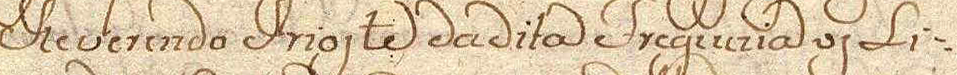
Reverendo Prioste da dita Freguezia os Li
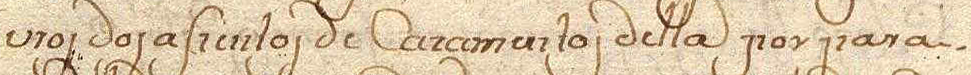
vros dos assentos de Cazamentos della por para
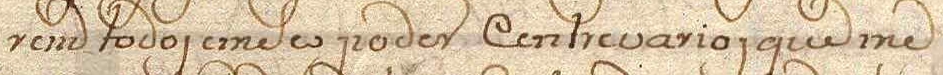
rem todos em seo poder e entre varios que me
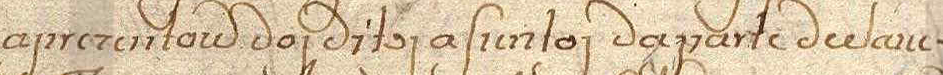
aprezentou dos ditos asuntos da parte de Sam
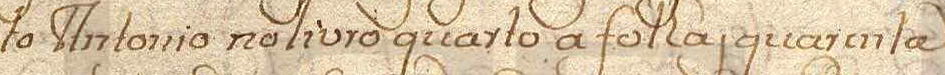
to Antonio no livro quarto a folhas quarenta
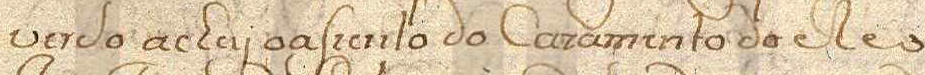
verso achey o assento do Cazamento do Reo
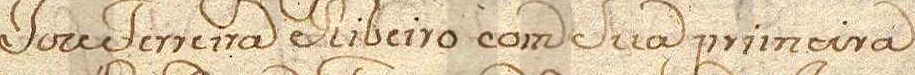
Ioze Ferreira Ribeiro com sua primeira
